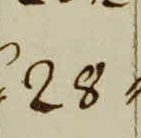28
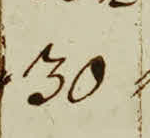30
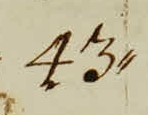43
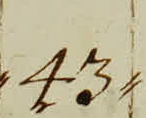43
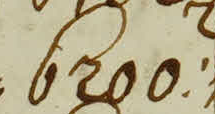6200.
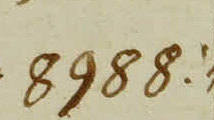8988
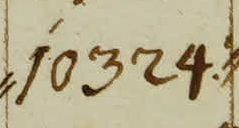10324
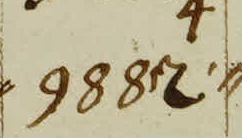9882.
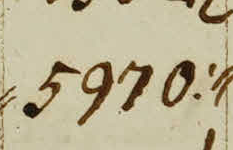5970.
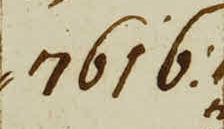7616.
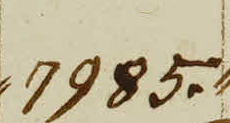7985.
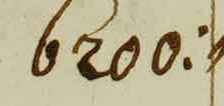6200.
